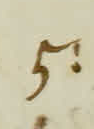5
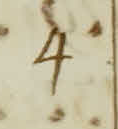4
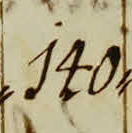140
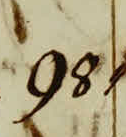98
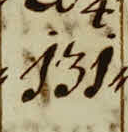131
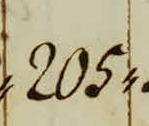205
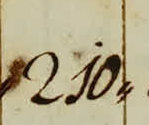210
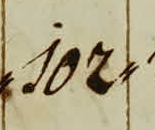102
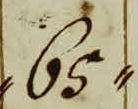65
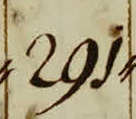291
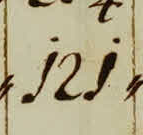121
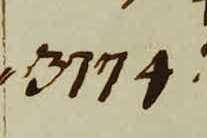3774
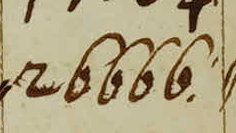26666
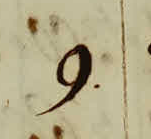9.
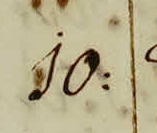10:
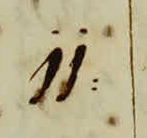11:
